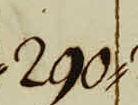290
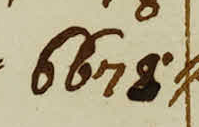6678
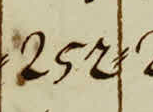252
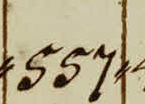557
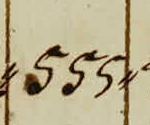555
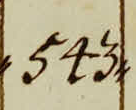543
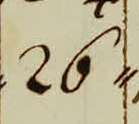26
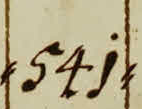541
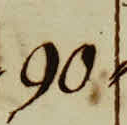90
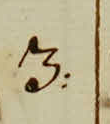3:
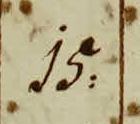15:
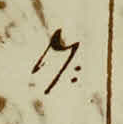7:
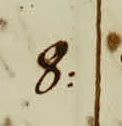8:
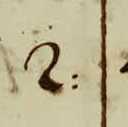2:
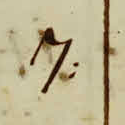7:
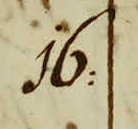16:
